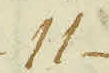11
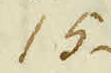15
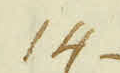14
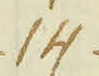14
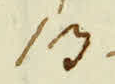13
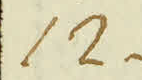12
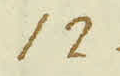12
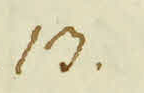13.
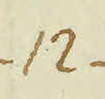12
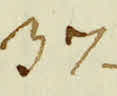37
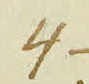4
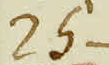25
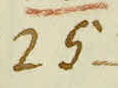25
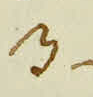3
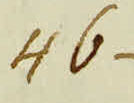46
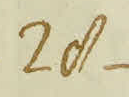28
